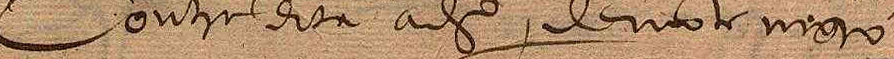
Contradita a djo de mōte negro
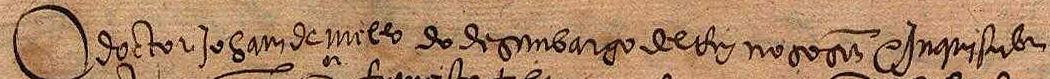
O doctor Joham de mello do desembargo del Rey noso sōr e Jnqujsidor
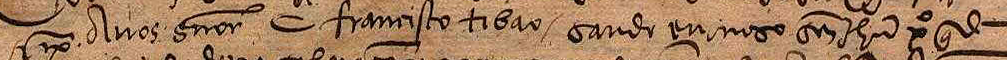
e c̄ꝭ. A uos sn̄or Cor francisto tibao / saude em noso sōr Jhū xo q̄ de
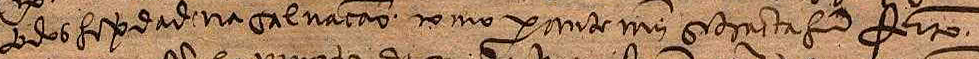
todos he ꝟdadeira saluação. como ꝑante mȳ se trata hū feito.
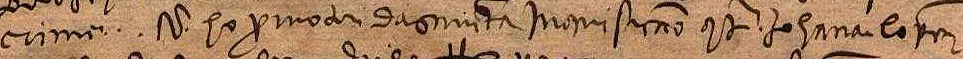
crime. .ss. ho ꝓmotor da sancta Jnquisição ꝯt̄ Johana lopez
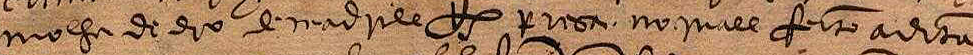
molher de djo de madrill Rꝭ presa no quall feito a dita
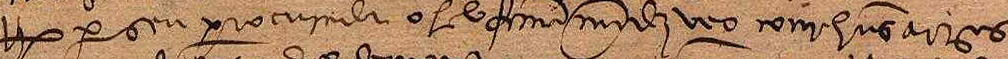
Rꝭ ꝑ seu procurador o Ldo fernā mēdez veo com hūs artos
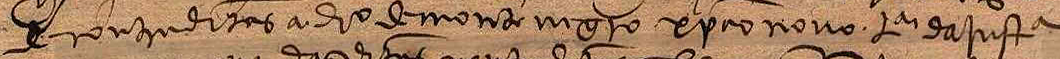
de contraditas a djo de monte negro xpão nouo . ta da Justa
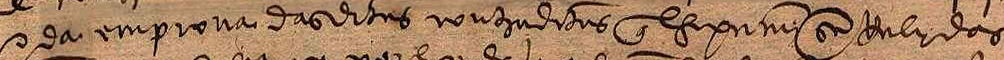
e da em proua das ditas contraditas q̄ lhe per mȳ sā Recebydas
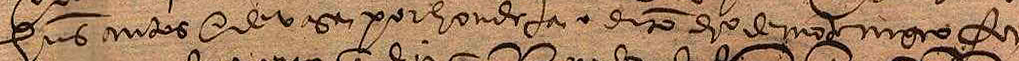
hūs autos e devasa por honde Ja o dito djo de mōtenegro foy
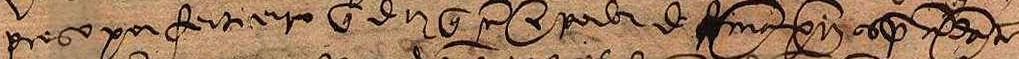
preso por feiticeiro q̄ diz q̄ sā ē poder de fernā pīz esp̄uā dāte
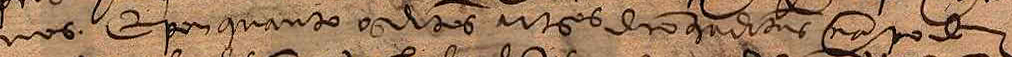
uos. E porquanto os ditos artos de c̄otraditas nā podem
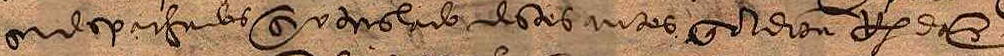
ser despachados sē o treslado destes autos q̄ A dita Rꝭ da ē
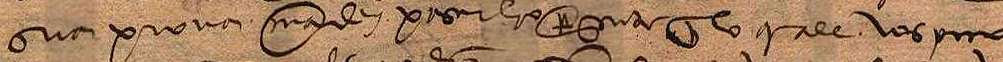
sua proua m̄adey pasar ho p̄sente p̄lo quall vos peço
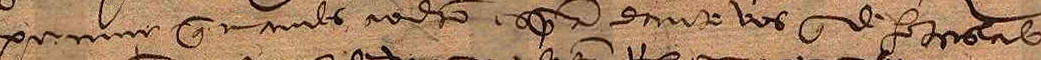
por merce q̄ mandes ao dt̄o esp̄uā dante vos q̄ de ho treslado
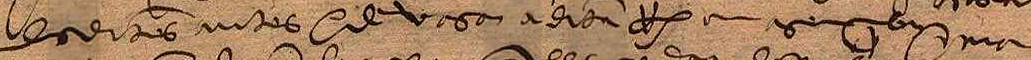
dos ditos autos e devasa a dita Rꝭ ou a seu p̄dor ē ma
